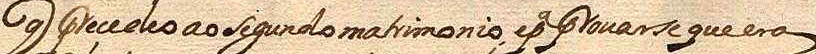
q̄ preçedeo ao segundo matrimonio, e p.a prouarse que era
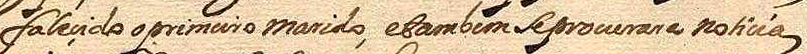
faleçido o primeiro marido, e também se procurara noticia
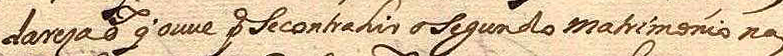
da rezaõ q̄ ouue p.a se contrahir o segundo matrimónio na
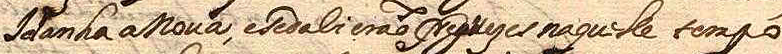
Idanha a Noua, e se dali erão freguezes naquelle tempo
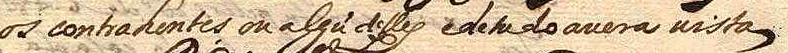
os contrahentes, ou algū delles e de tudo auera uista
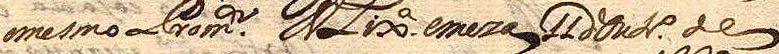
o mesmo Prom.or V Lix.a e meza, 11 d̄ Out.o de
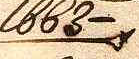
1663
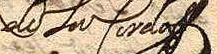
de LaCerda
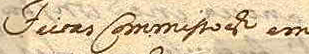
Feitas Commissoes̄ em
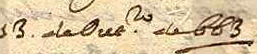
13 de Out.ro de 663
